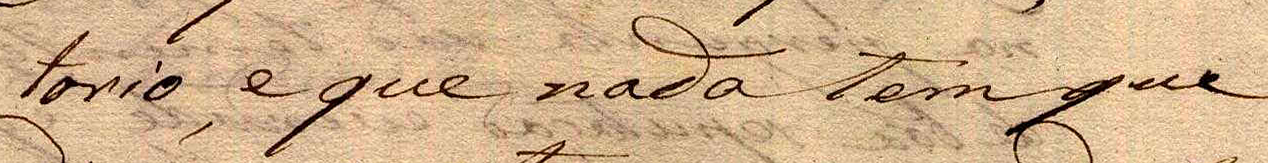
torio, e que nada tem que
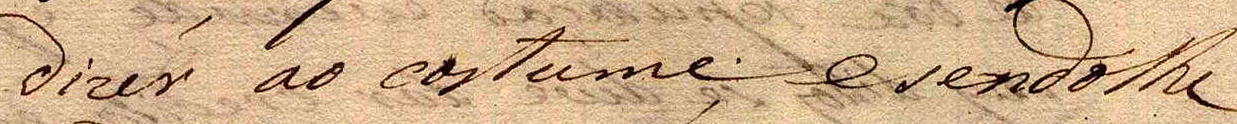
dizer ao costume; e sendolhe
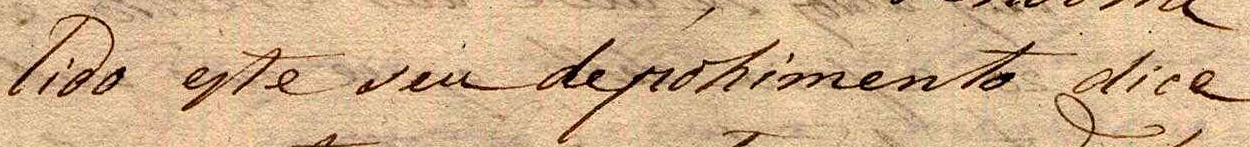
lido este seu depohimento dice
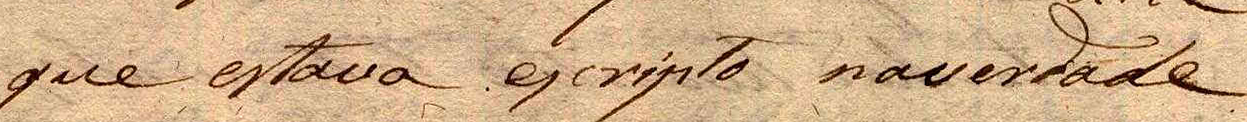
que estava escripto na verdade
